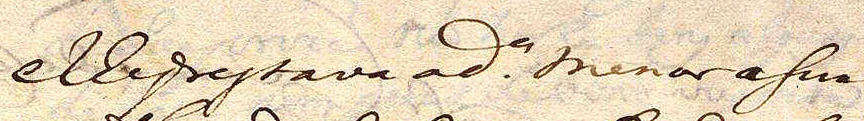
e lhe prestava a d.a menor a sua
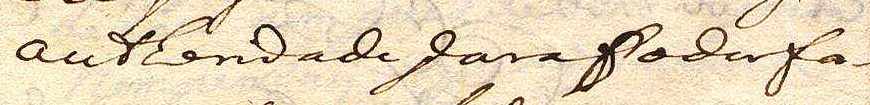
authoridade para poder fa
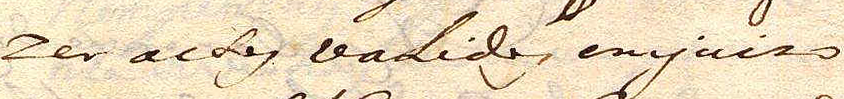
Zer actos vaLidos em juizo
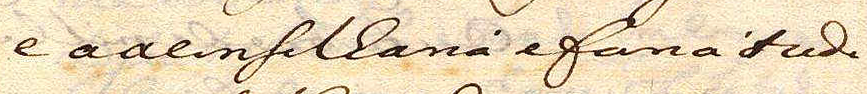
e a aconselharia e faria tudo
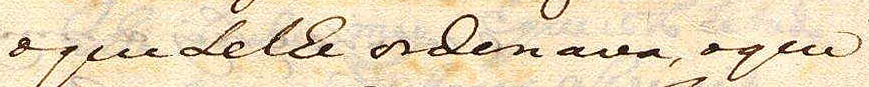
o que se lhe ordenava, o que
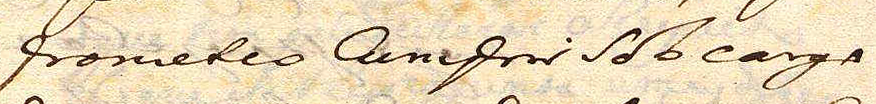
prometeo Cumprir sob cargo
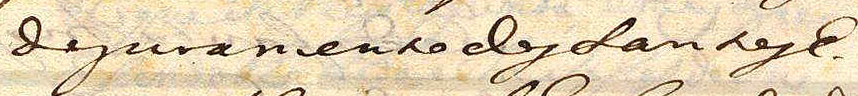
do juramento dos santos E
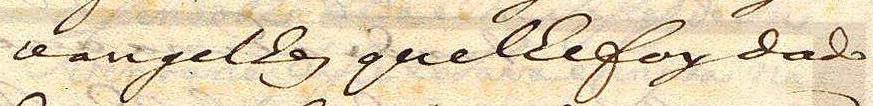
vangelhos que lhe foy dado
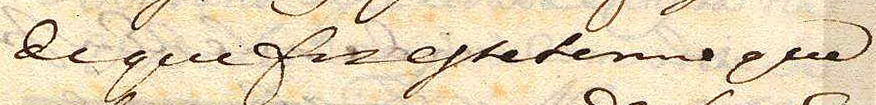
de que fiz este termo que
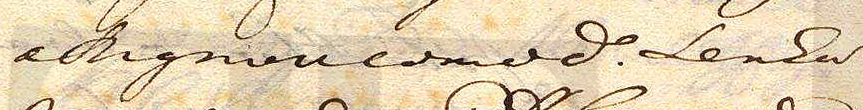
assignou com o d.o Senhor
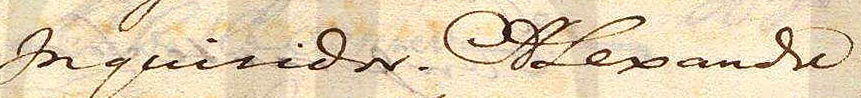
Inquizidor ALexandre
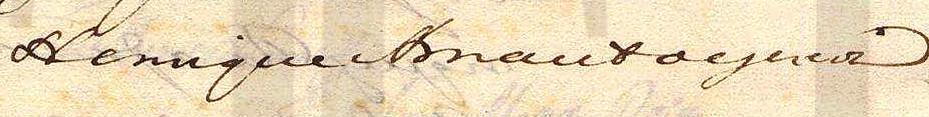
Henrique Arnaut o escrevi
